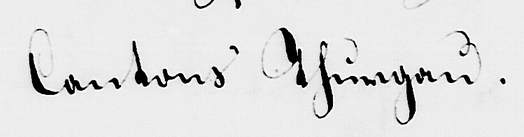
Cantons Thurgau.
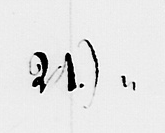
24.)
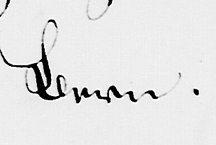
Bern.
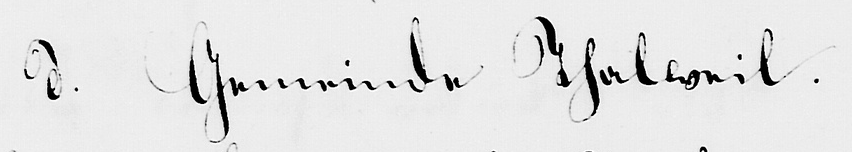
d. Gemeinde Thalweil.
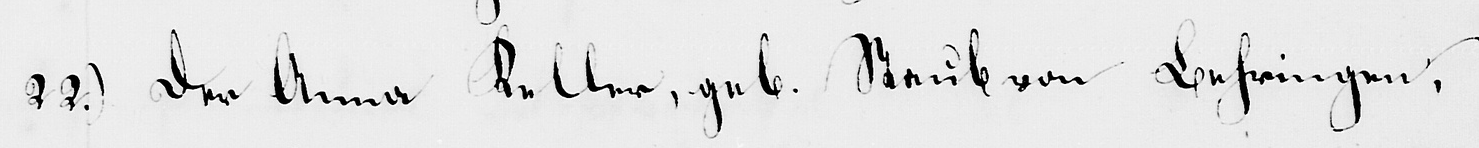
22.) der Anna Keller, geb. Staub von Behringen,
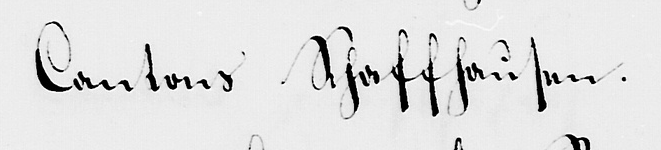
Cantons Schaffhausen.
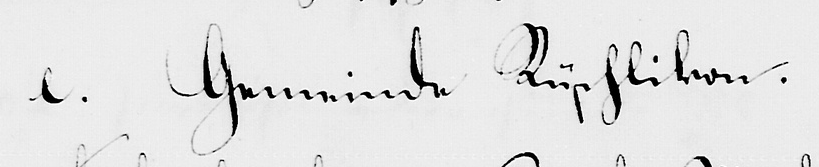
e. Gemeinde Rüschlikon.
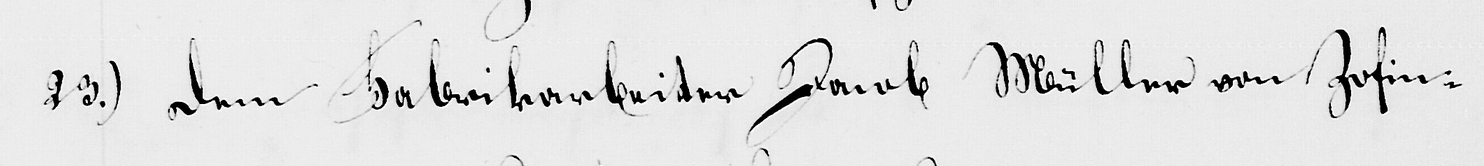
23.) dem Fabrikarbeiter Jacob Müller von Zofin¬
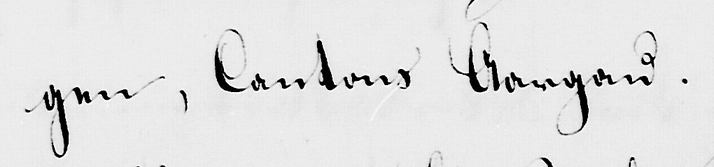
gen, Cantons Aargau.
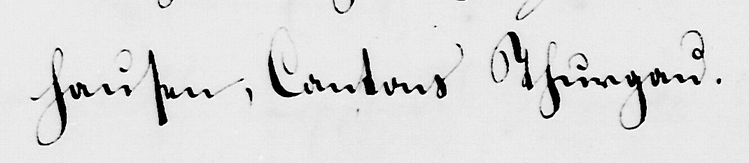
hausen, Cantons Thurgau.
